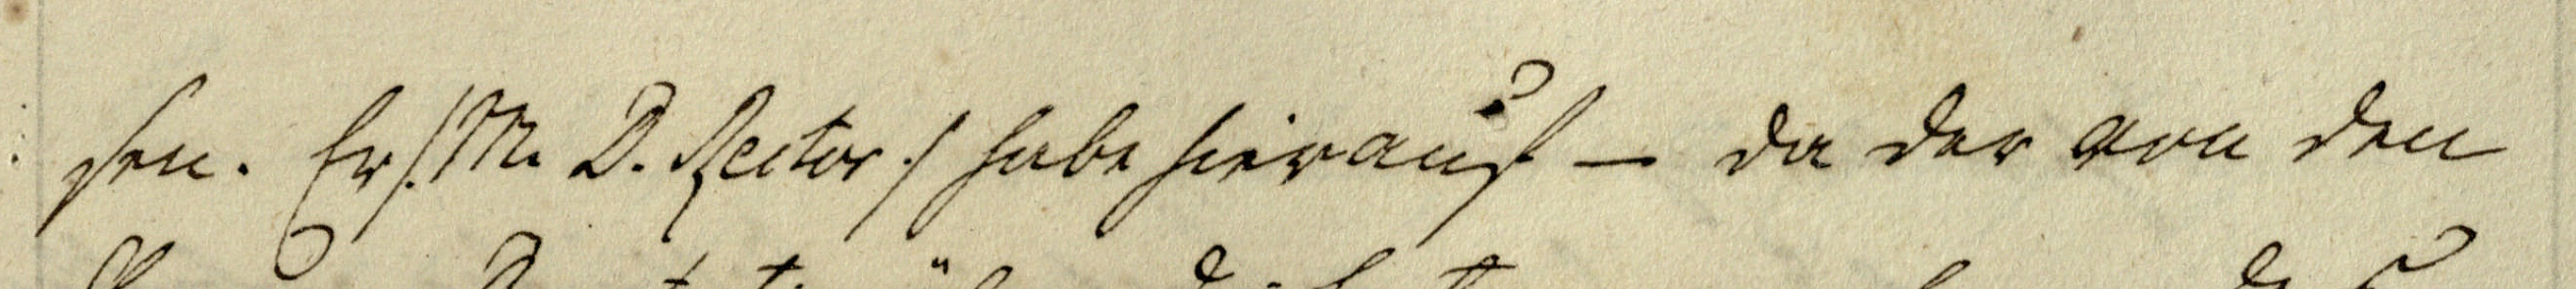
sen. Er /. M. D. Rector ./ habe hierauf - da der von den
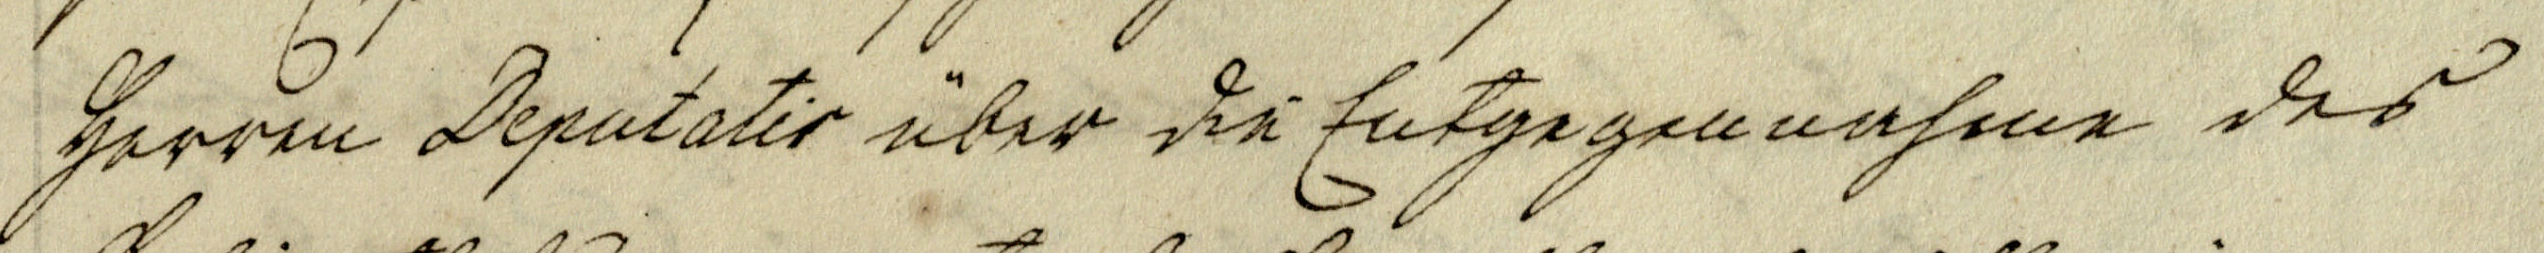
Herren Deputatis über die Entgegennahme des
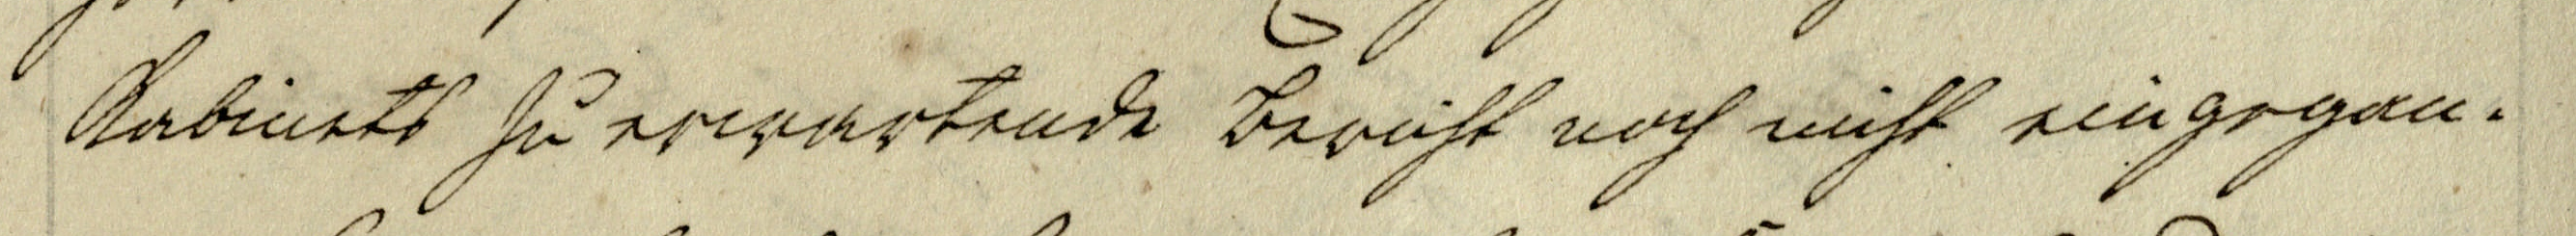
Kabinets zu erwartende Bericht noch nicht eingegan¬
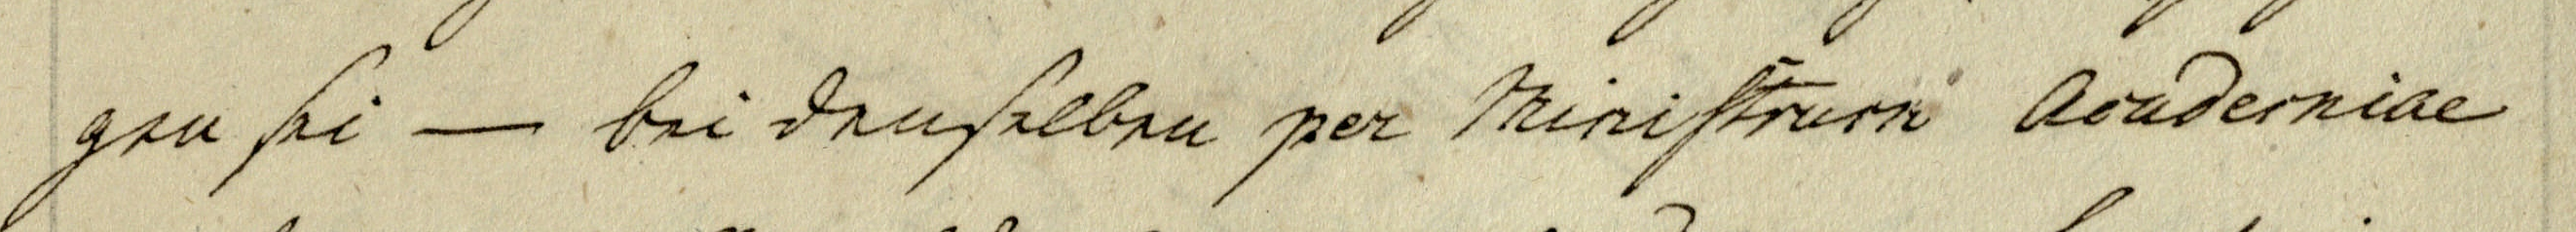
gen sei - bei denselben per Ministrum Academiae
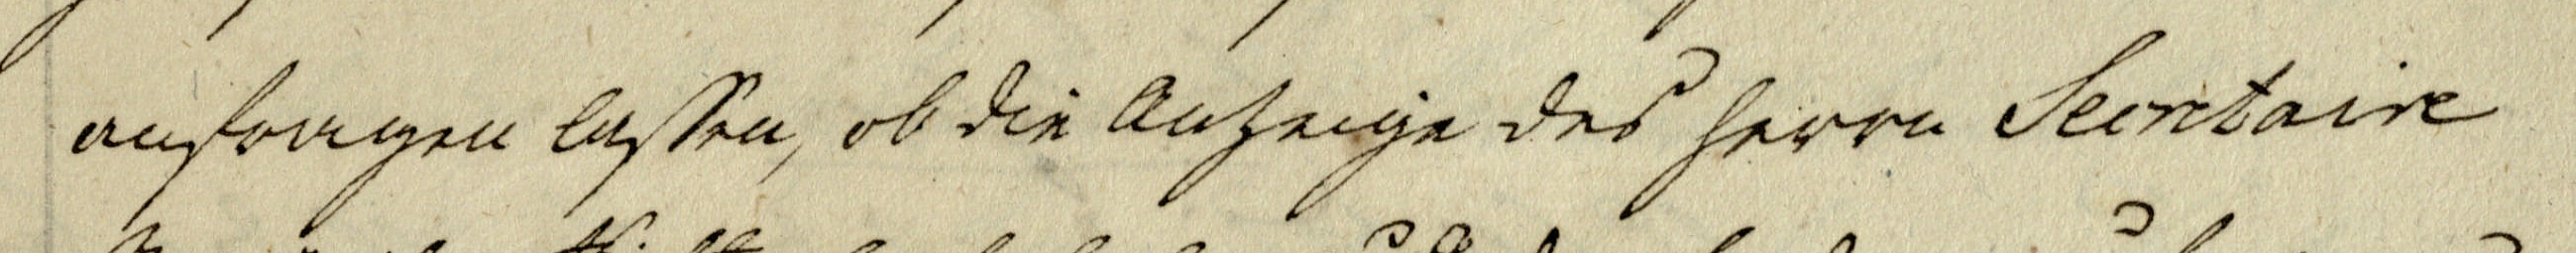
anfragen lassen, ob die Anzeige des Herrn Secretaire
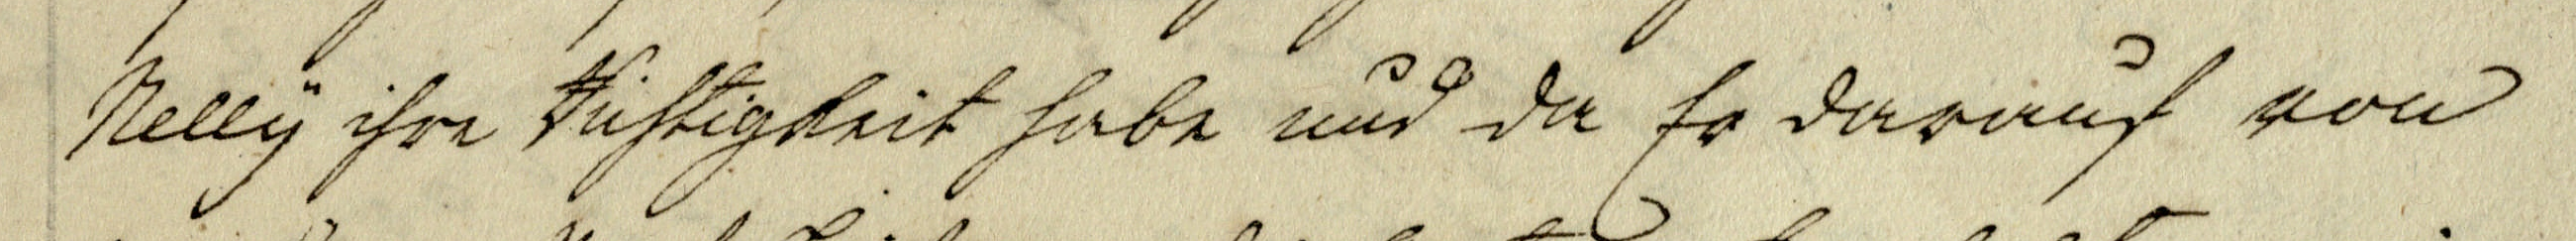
Nellÿ ihre Richtigkeit habe und da Er darauf von
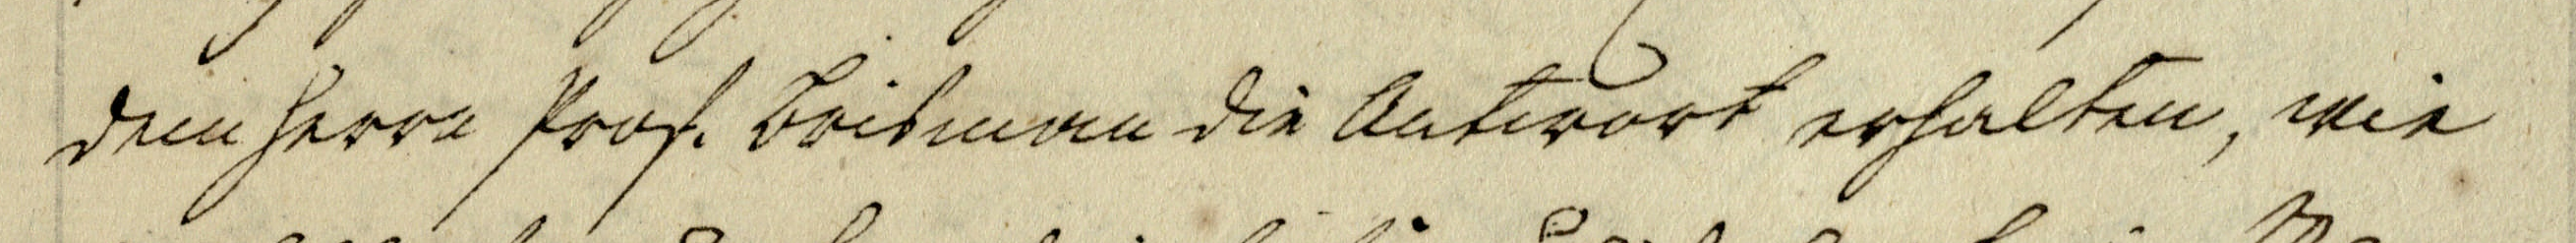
dem Herrn Prof. Brisman die Antwort erhalten, wie
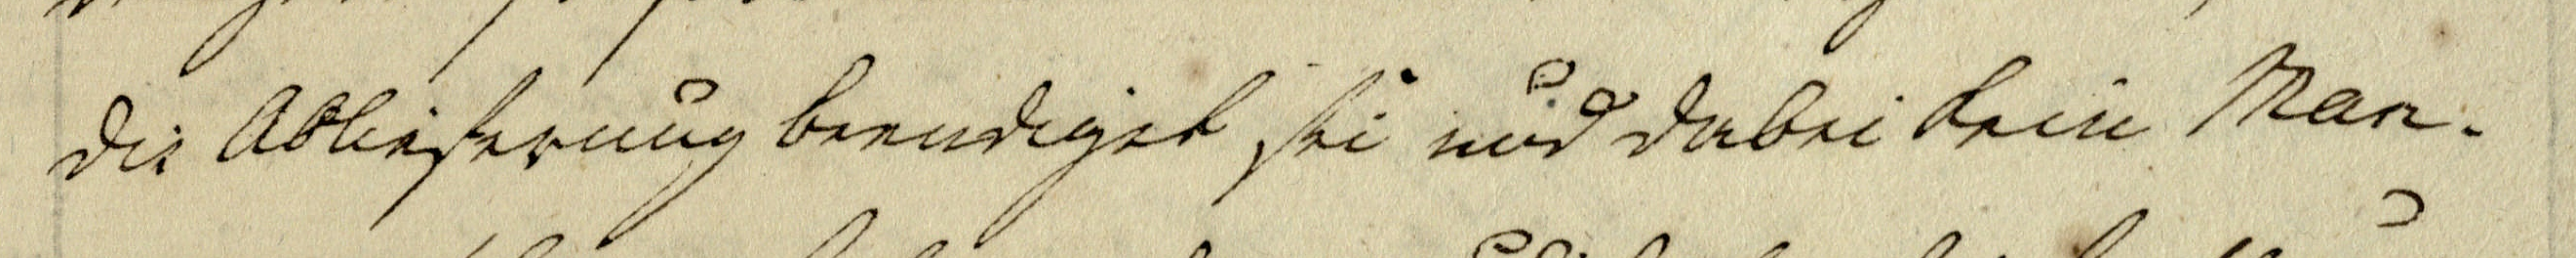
die Ablieferung beendiget sei und dabei kein Man¬
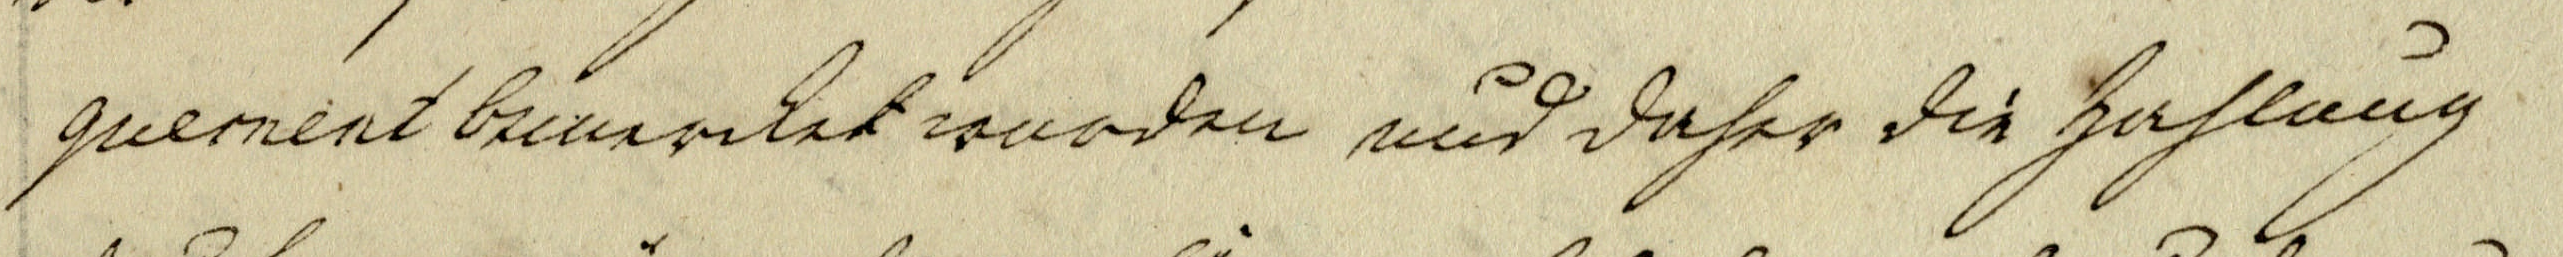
quement bemercket wurden und daher die Zahlung
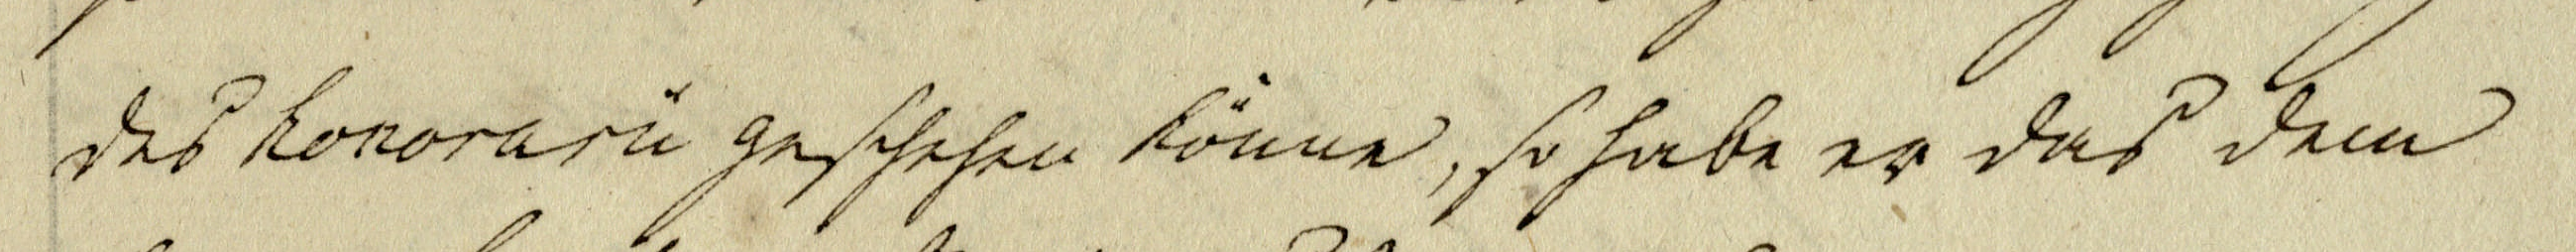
des honorarii geschehen könne, so habe er das dem
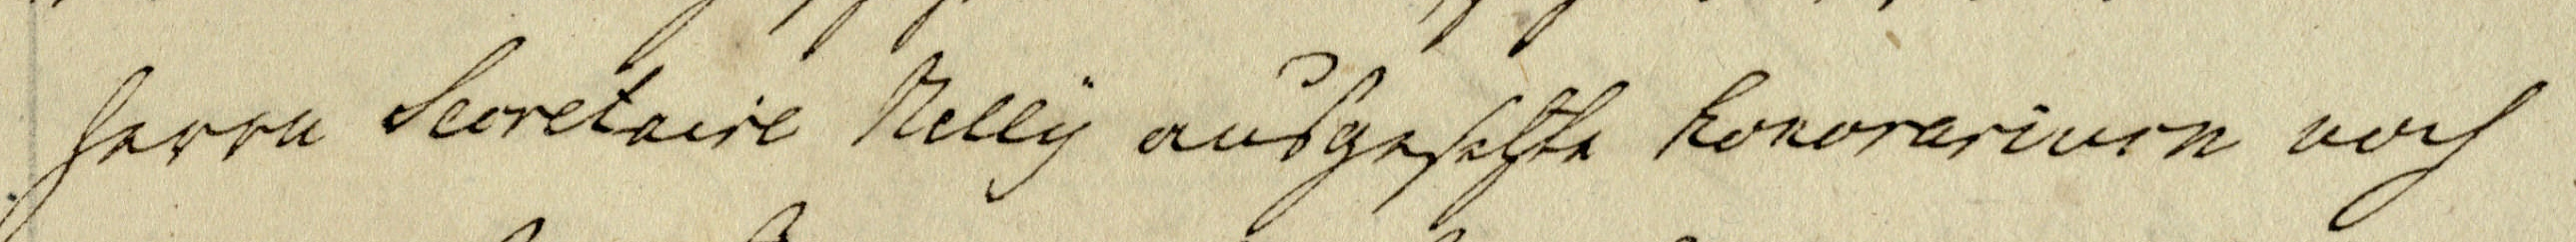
Herrn Secretaire Nellÿ ausgesetzte honorarium noch
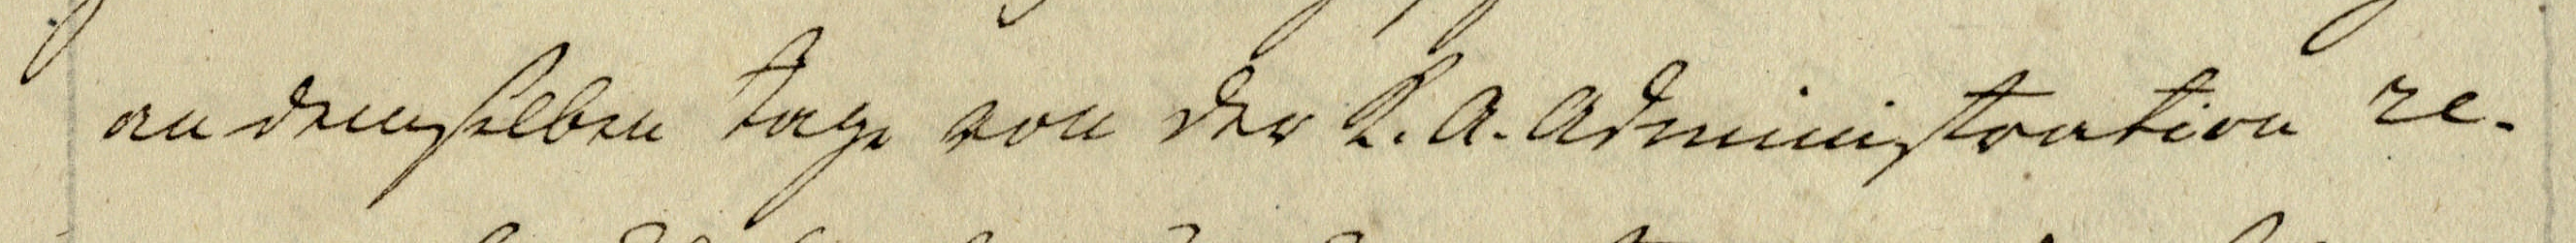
an demselben Tage von der K. A. Administration re¬
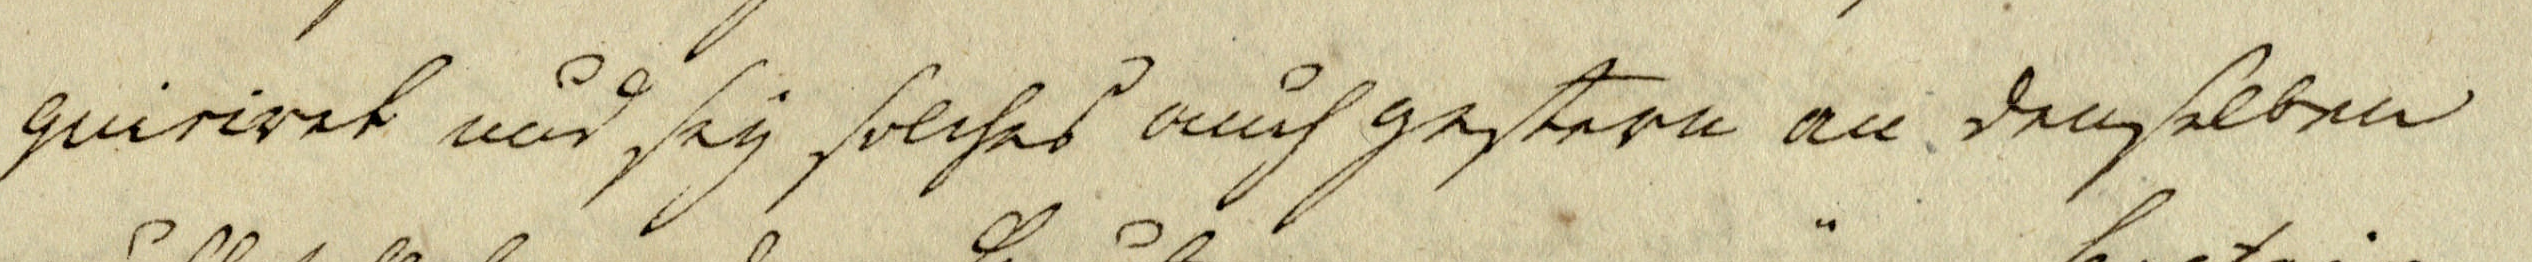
quiriret und seÿ solches auch gestern an denselben
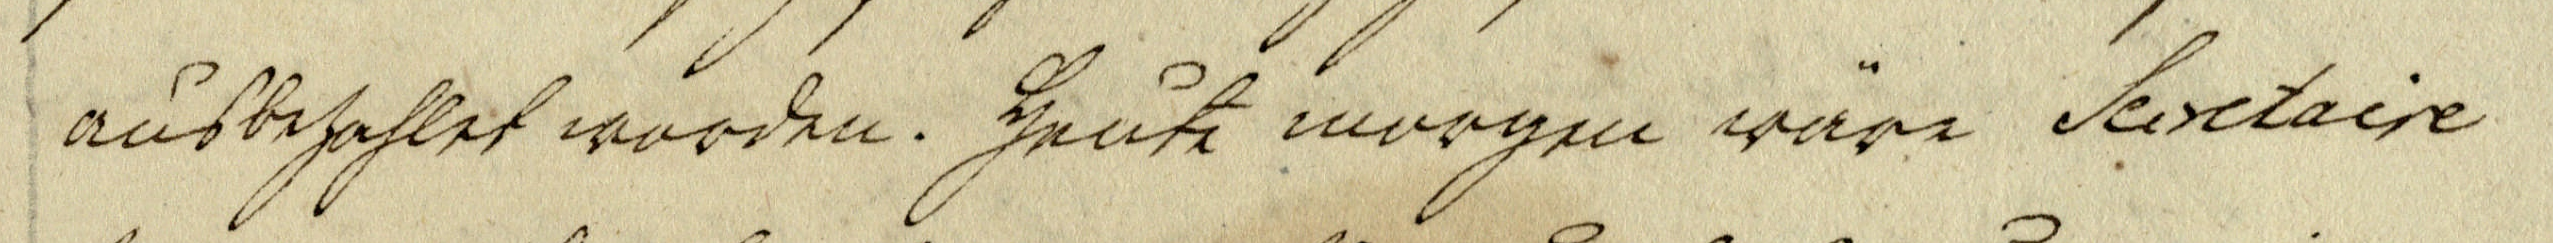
ausbezahlet worden. Heute morgen wäre Secretaire
